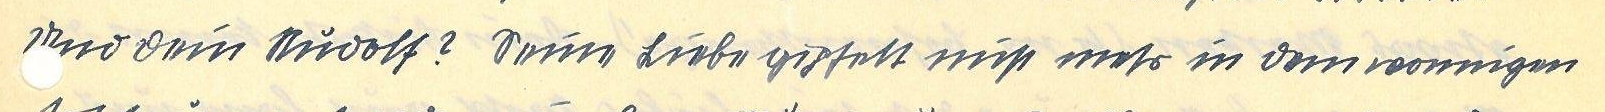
Und Dein? Seine Liebe gipfelt nicht mehr in dem wonnigen
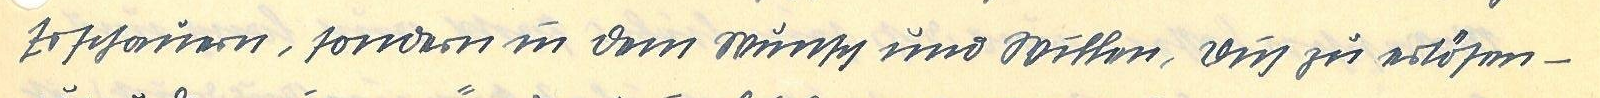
Erschauern, sondern in dem Wunsch und Willen, Dich zu erlösen –
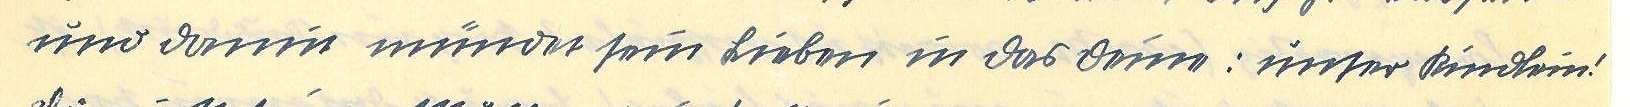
und damit mündet sein Lieben in das Deine: unser Kindlein!
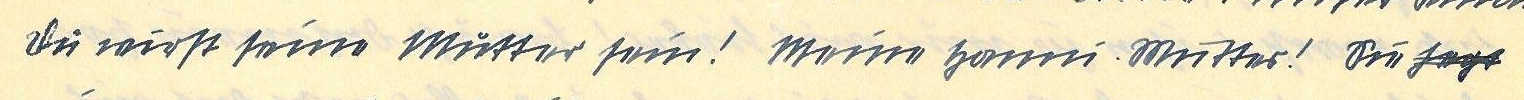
Du wirst seine Mutter sein! Meine Mutter! Sie hegt
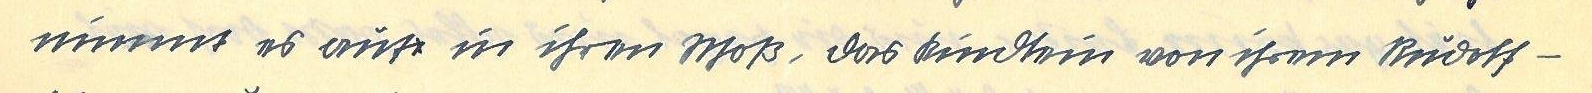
nimmt es aufr in ihren Schoß, das Kindlein von ihrem –
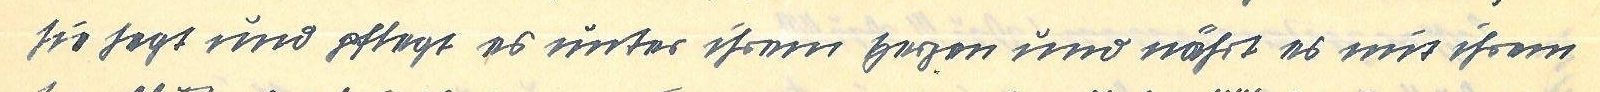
sie hegt und pflegt es unter ihrem Herzen und nährt es mit ihrem
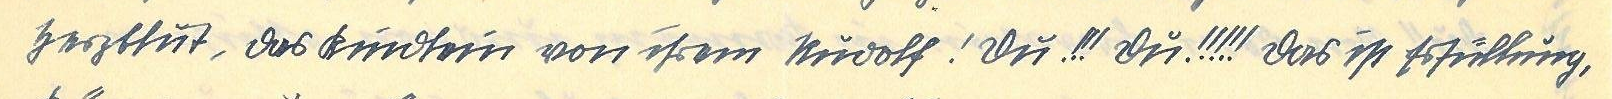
Herzblut, das Kindlein von ihrem! Du!!! Du!!!!! Das ist Erfüllung,
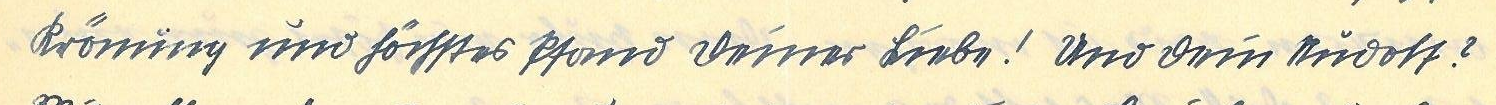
Krönung und höchstes Pfand Deiner Liebe! Und Dein
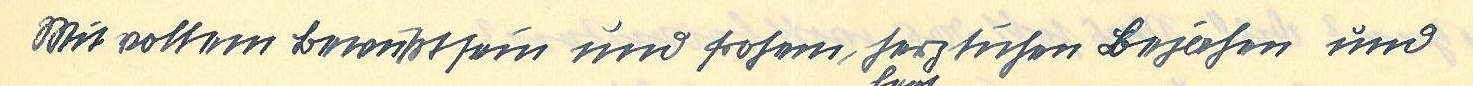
Mit vollem Bewußtsein und frohem, herzlichen Bejahen und
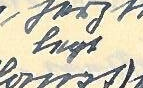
legt
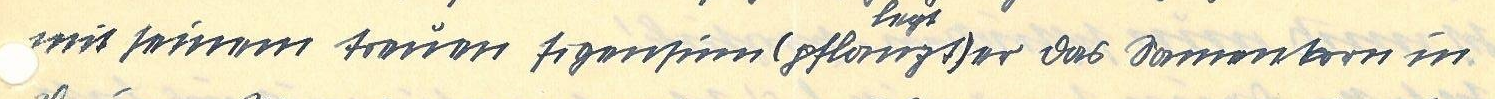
mit seinem treuen Eigensinn (pflanzt) er das Samenkorn in
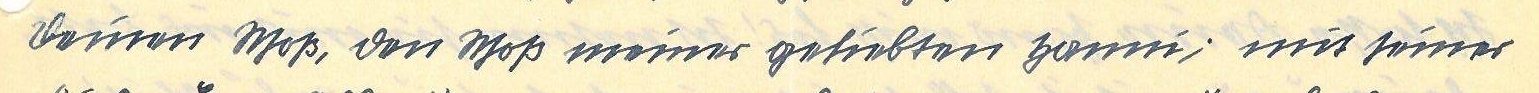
Deinen Schoß, den Schoß meiner geliebten; mit seiner
